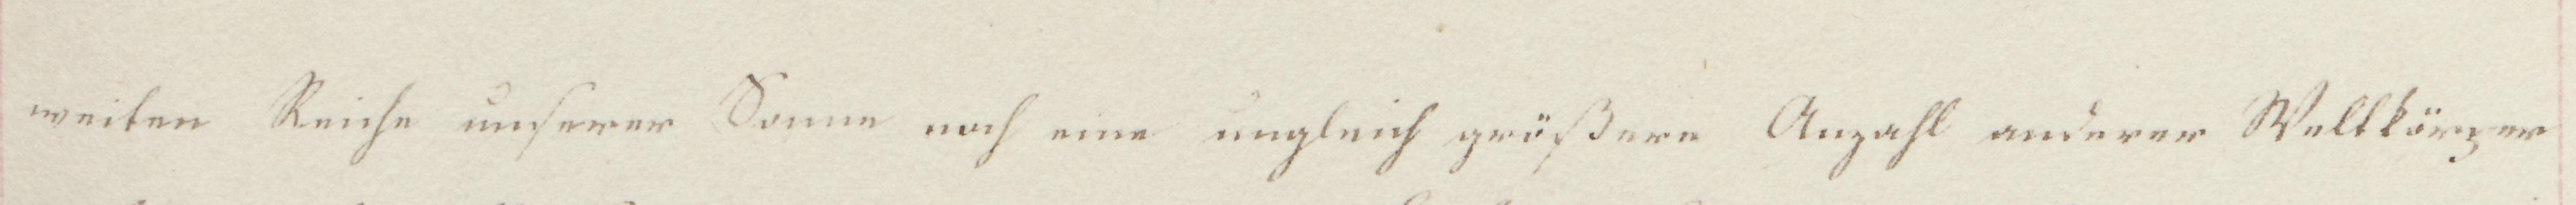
weiten Reiche unserer Sonne noch eine ungleich größere Anzahl anderer Weltkörper
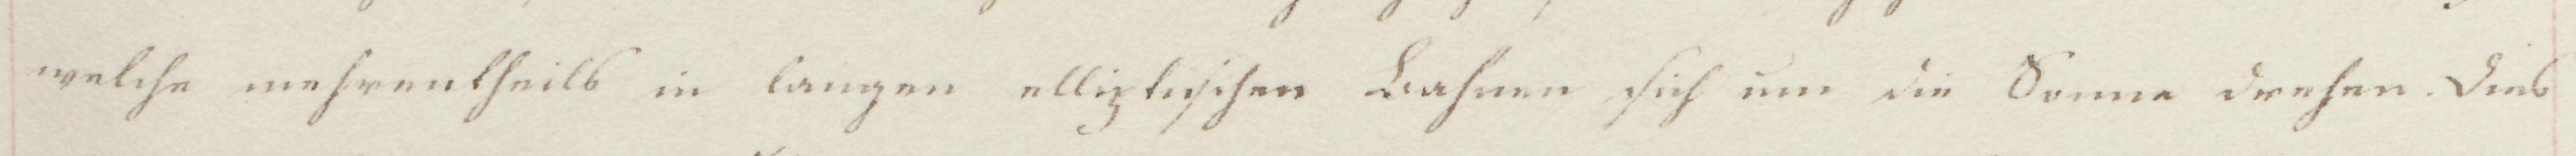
welche mehrentheils in langen elliptischen Bahnen sich um die Sonne drehen. Dies
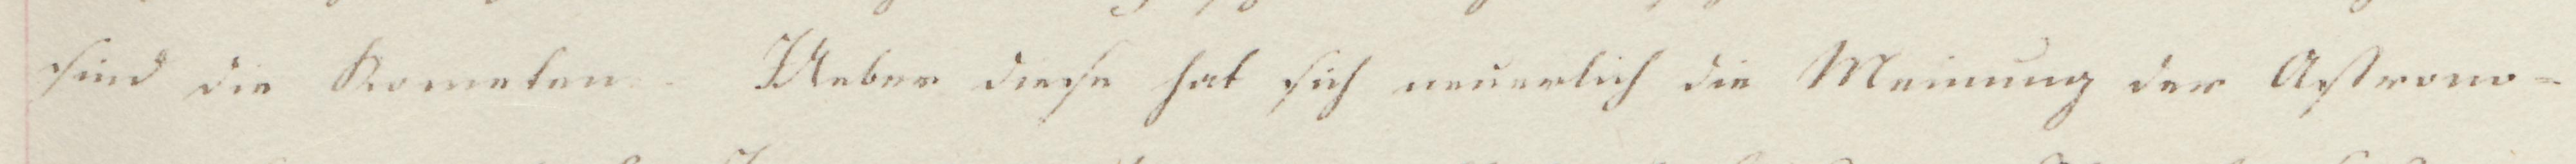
sind die Kometen. JUeber diese hat sich neuerlich die Meinung der Astrono-
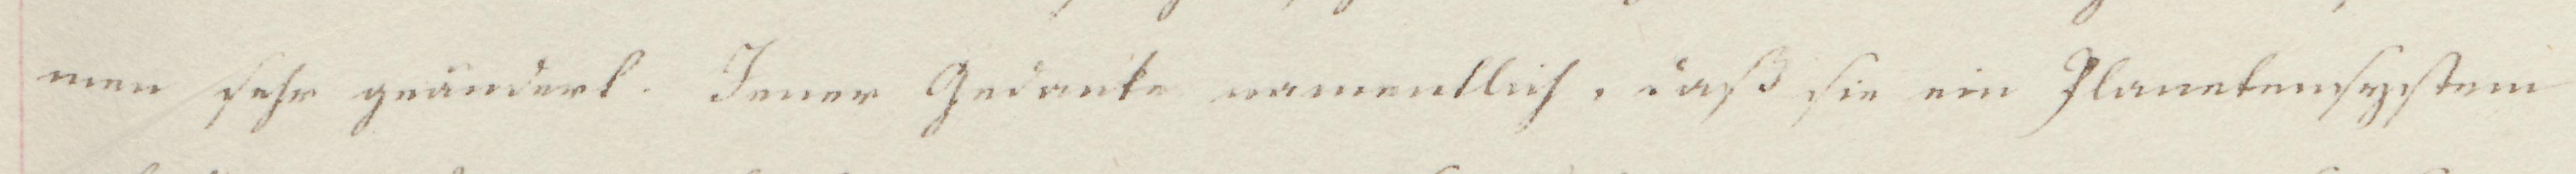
men sehr geändert. Jener Gedanke namentlich, daß sie ein Planetensystem
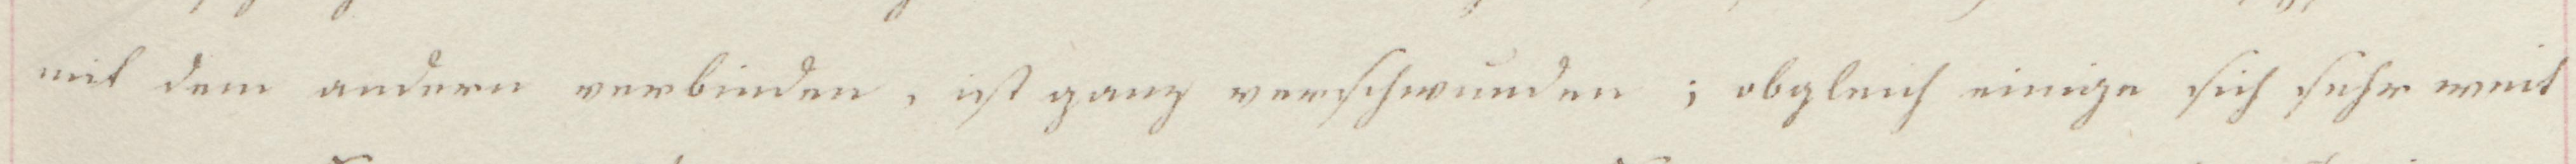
mit dem andern verbinden, ist ganz verschwunden; obgleich einige sich sehr weit
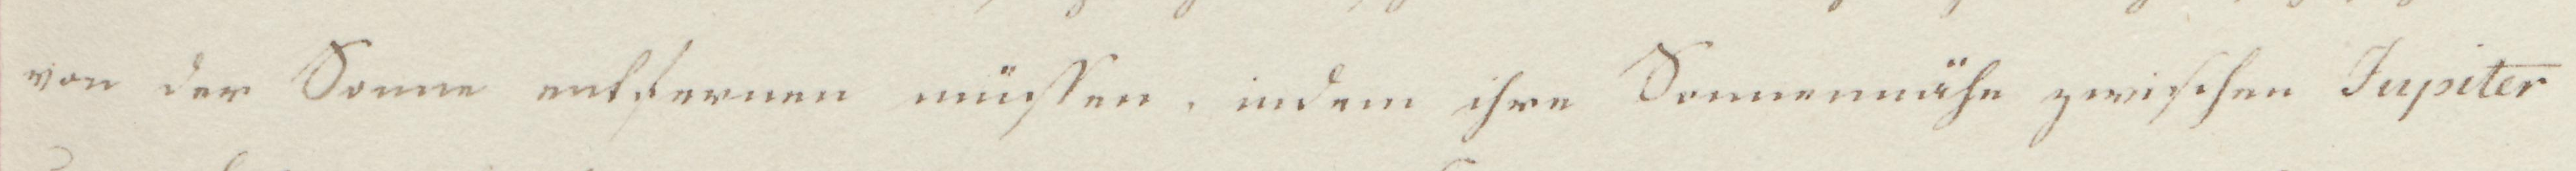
von der Sonne entfernen müssen, indem ihre Sonnennähe zwischen Jupiter
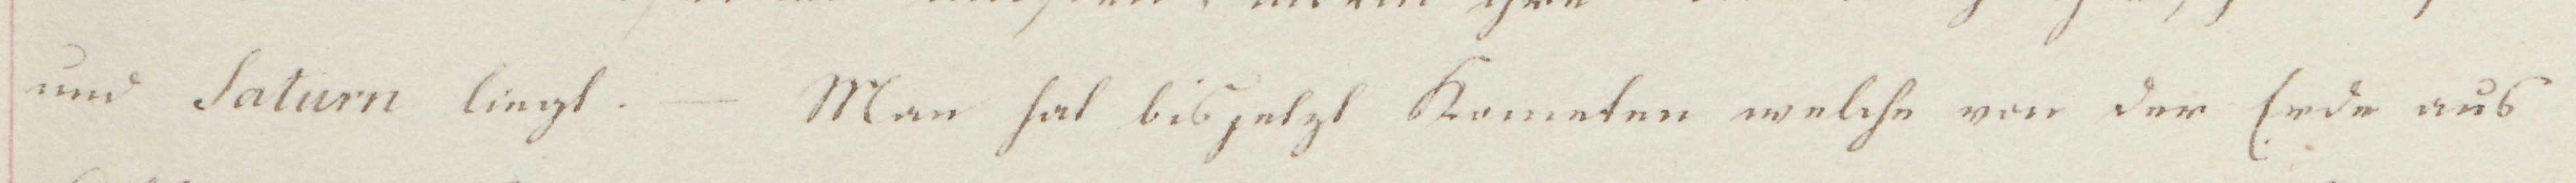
und Saturn liegt. – Man hat bis jetzt Kometen welche von der Erde aus
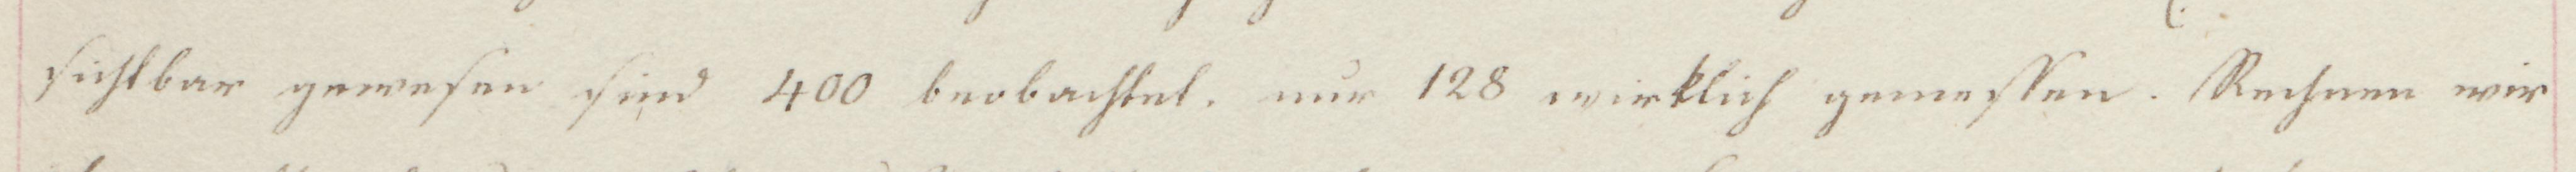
sichtbar gewesen sind 400 beobachtet, nur 128 wirklich gemessen. Rechnen wir
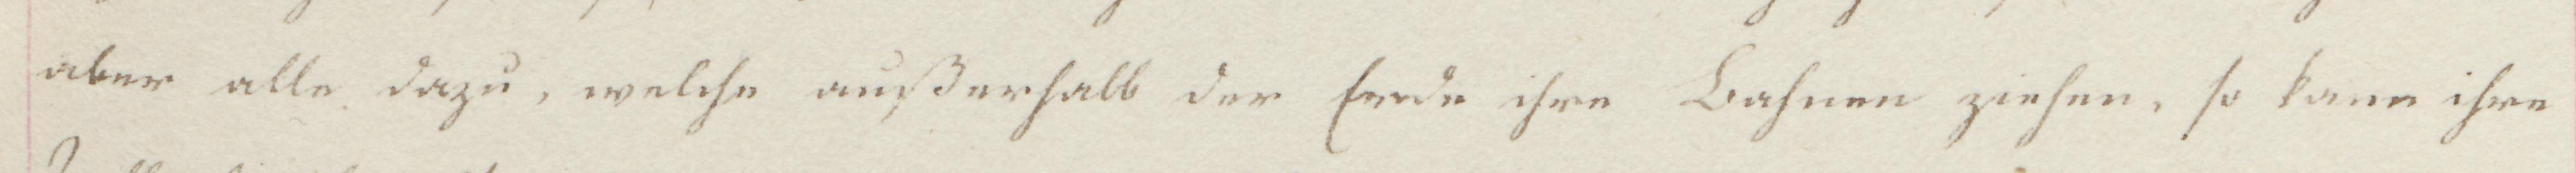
aber alle dazu, welche außerhalb der Erde ihre Bahnen ziehen, so kann ihre
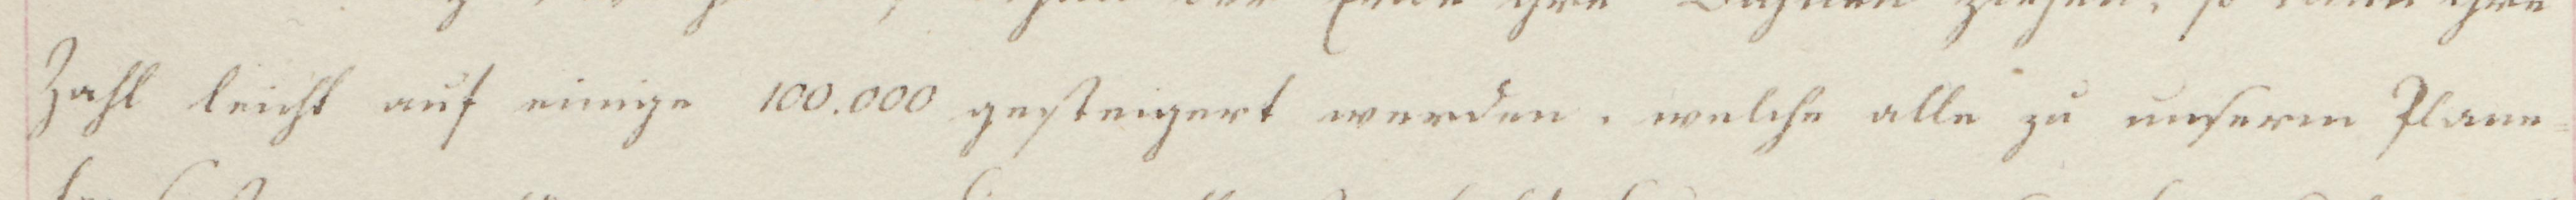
Zahl leicht auf einige 100,000 gesteigert werden, welche alle zu unserm Plane-
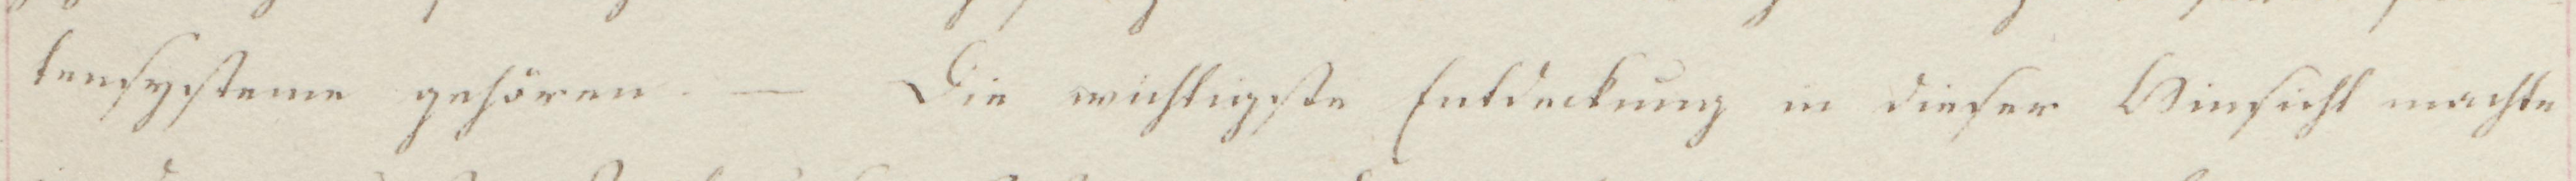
tensystem gehören. – Die wichtigste Entdeckung in dieser Hinsicht machte
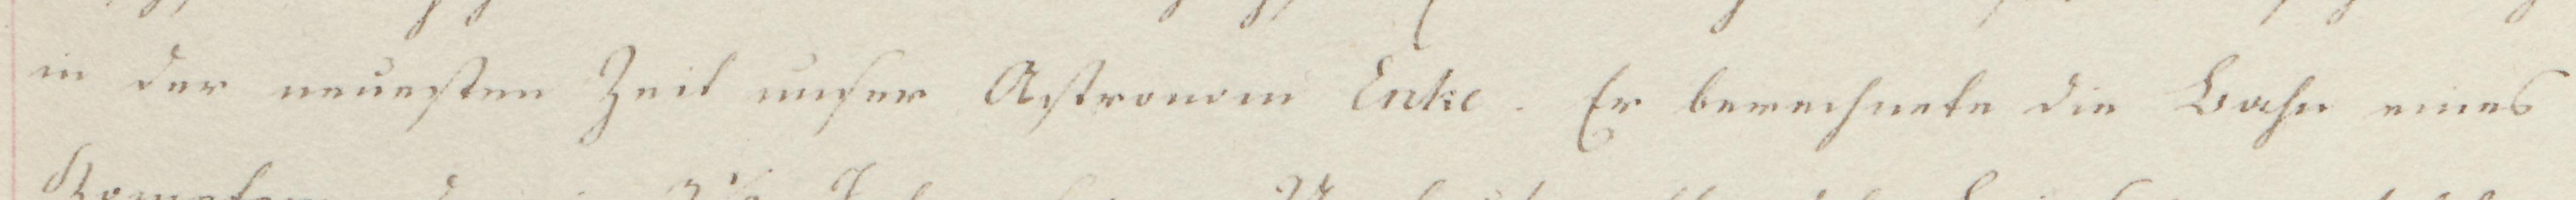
in der neuesten Zeit unser Astronom Enke. Er berechnete die Bahn eines
